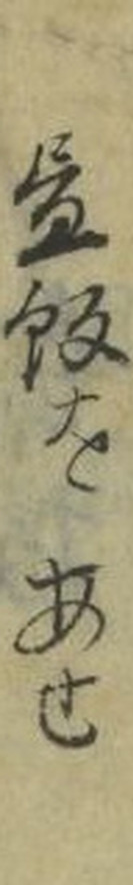昼飯をあせ
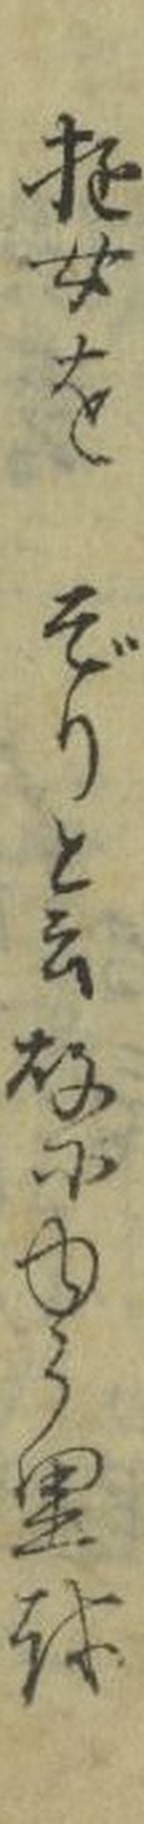遊女をぞりと云故にゆう里を
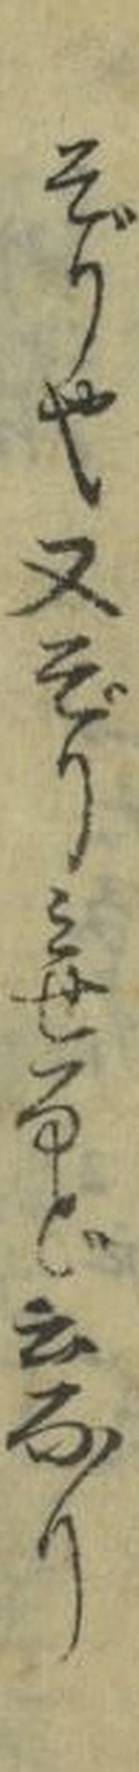ぞりや又ぞりみせなど云なり
